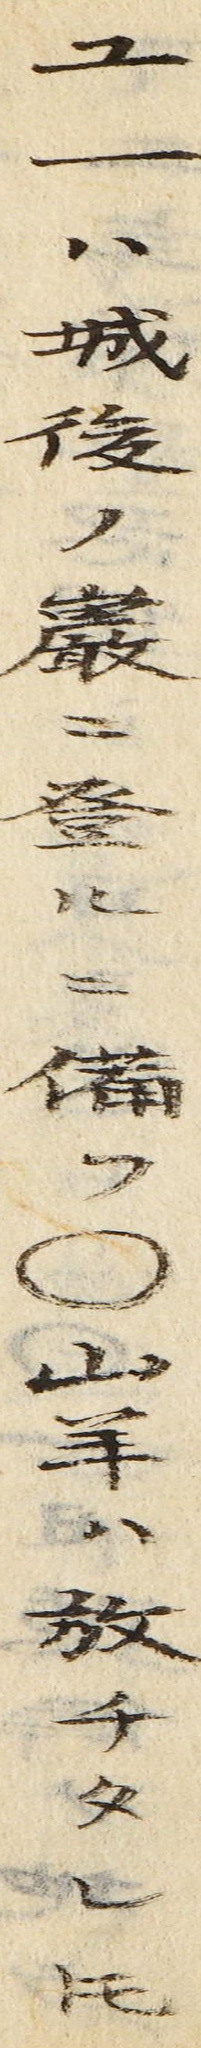ユ一ハ城後ノ巌ニ登ルニ備フ◯山羊ハ放チタレトモ
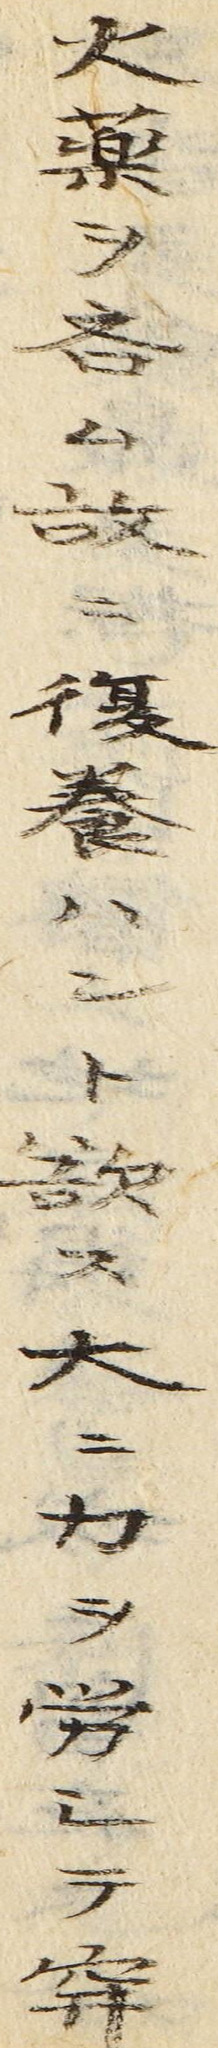火薬ヲ吝ム故ニ復養ハント欲ス大ニ力ヲ労シテ穽
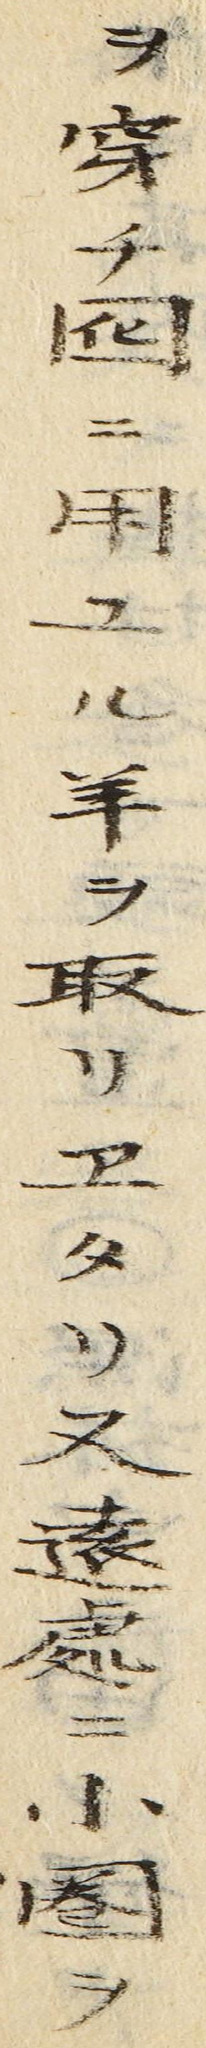ヲ穿チ囮ニ用ユル羊ヲ取リヱタリ又遠処ニ小圏ヲ

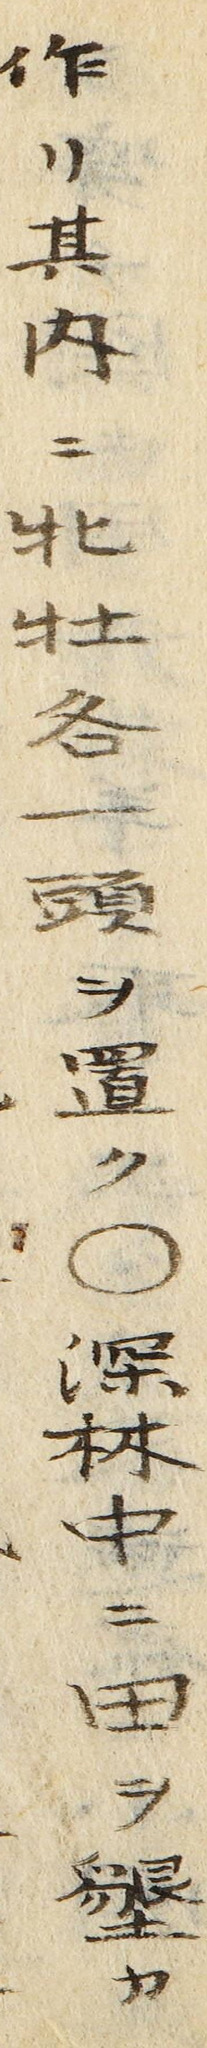作リ其内ニ牝牡各一頭ヲ置ク◯深林中ニ田ヲ墾カ
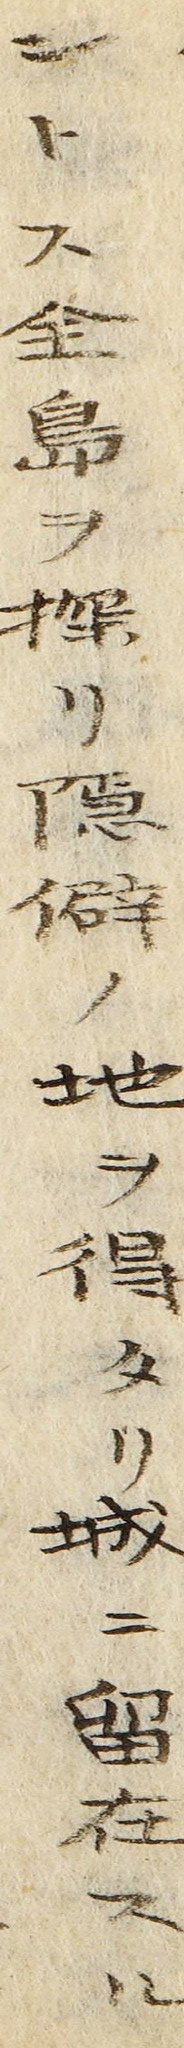ントス全島ヲ探リ隠僻ノ地ヲ得タリ城ニ留在スル
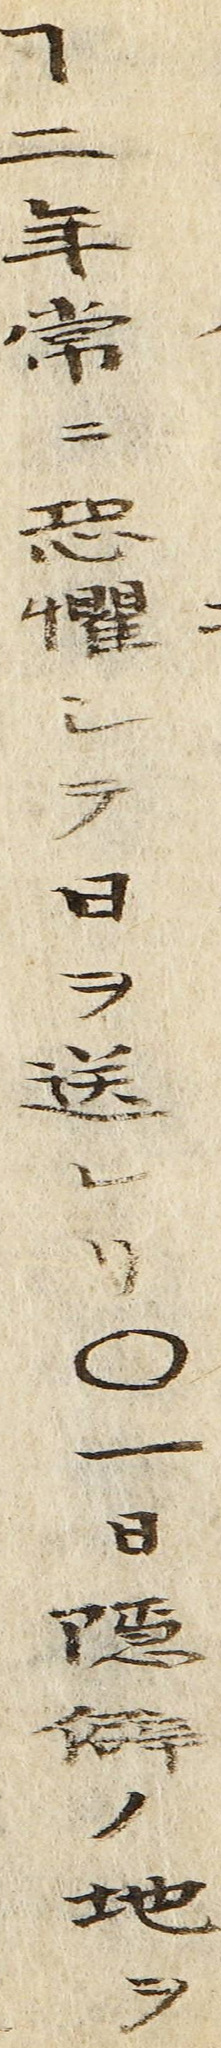コト二年常ニ恐懼シテ日ヲ送レリ◯一日隠僻ノ地ヲ
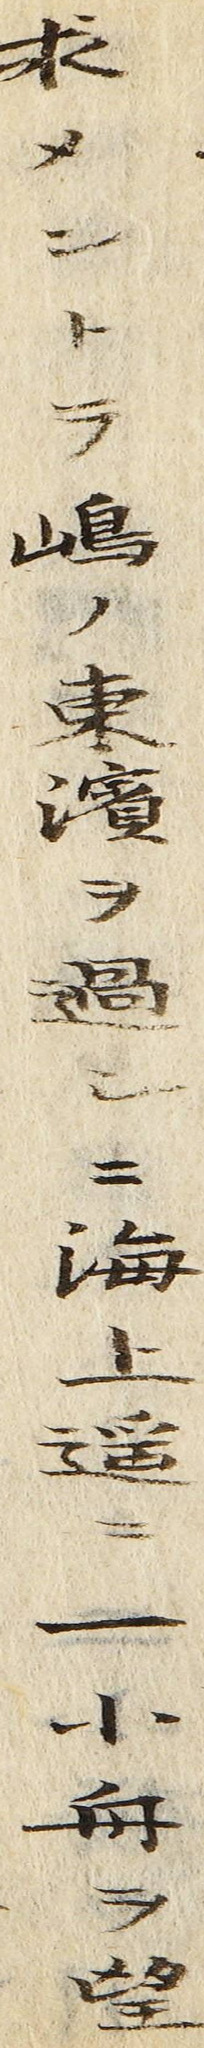求メントテ嶋ノ東浜ヲ過シニ海上遥ニ一小舟ヲ望
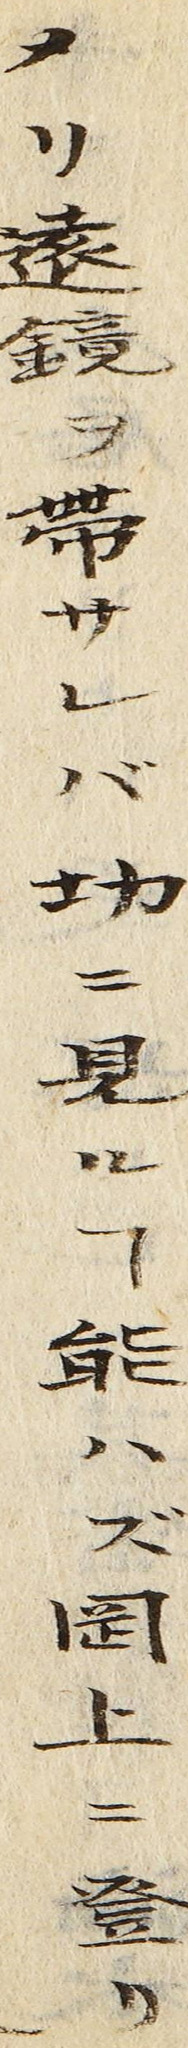メリ遠鏡ヲ帯サレバ功ニ見ルコト能ハズ岡上ニ登リ
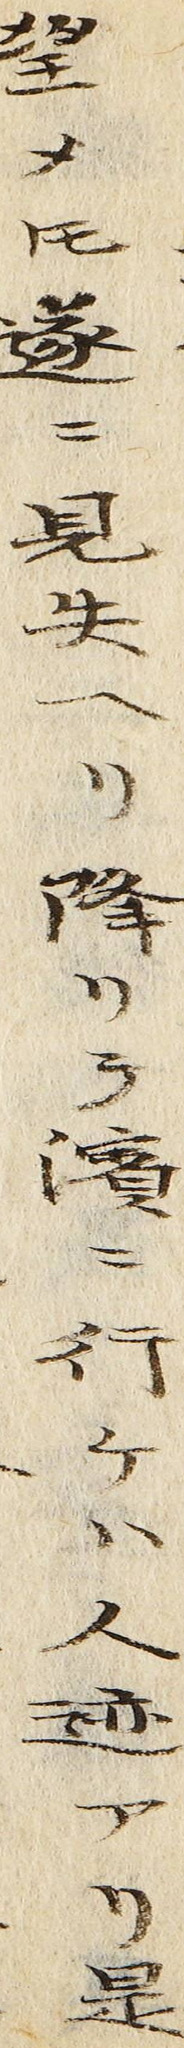望メトモ遂ニ見失ヘリ降リテ浜ニ行ケバ人迹アリ是
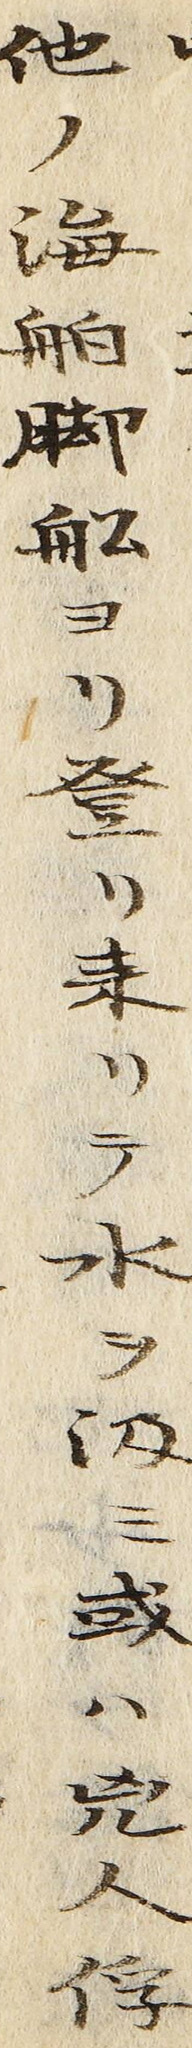他ノ海舶脚船ヨリ登リ来リテ水ヲ汲ミ或ハ兇人俘
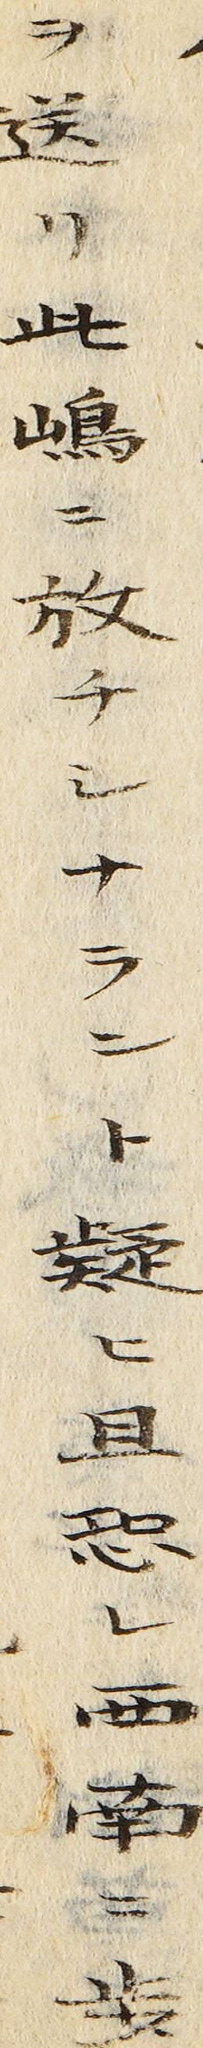ヲ送り此嶋ニ放チシナラント疑ヒ且恐レ西南ニ歩
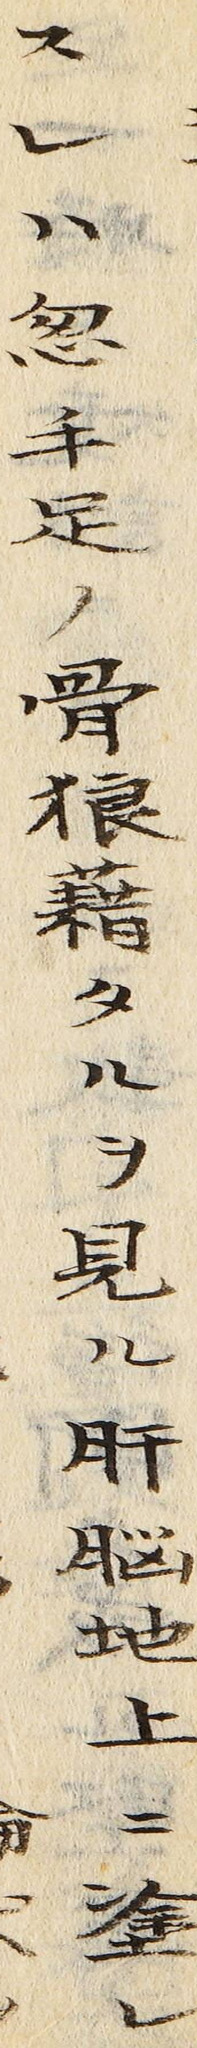スレハ忽手足ノ骨狼藉タルヲ見ル肝脳地上ニ塗レ
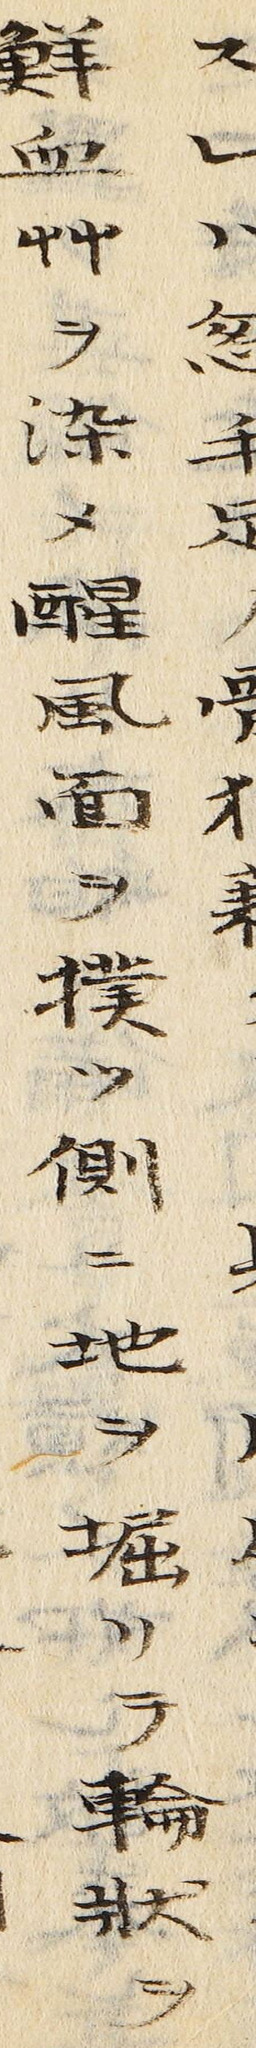鮮血艸ヲ染メ醒風面ヲ撲ツ側ニ地ヲ掘リテ輪状ヲ
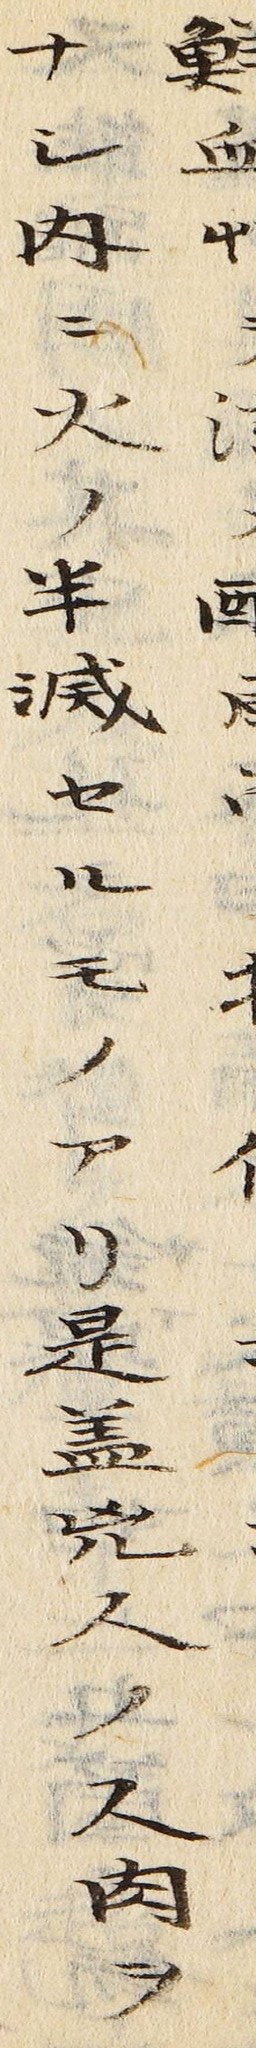ナシ内ニ火ノ半滅セルモノアリ是盖兇人ノ人肉ヲ
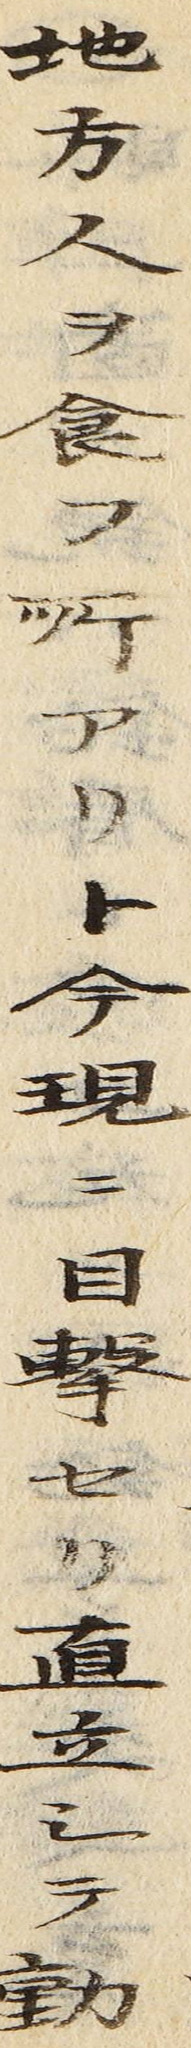地方人ヲ食フ所アリト今現ニ目撃セリ直立シテ動
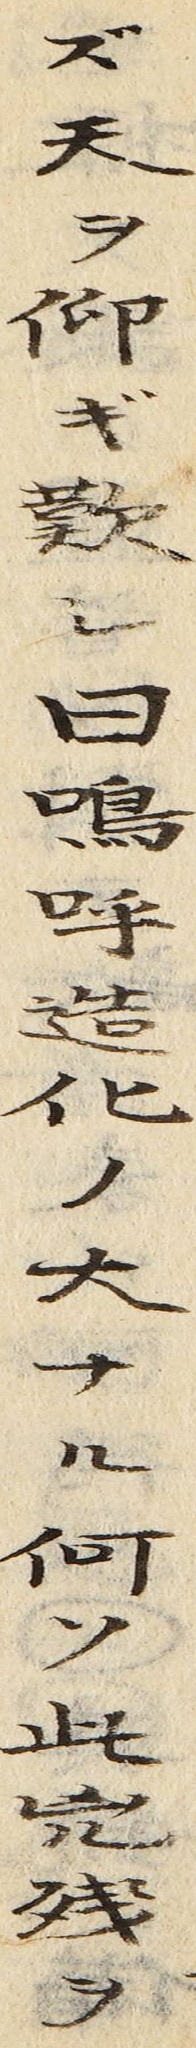ズ天ヲ仰ギ歎シ曰嗚呼造化ノ大ナル何ソ此兇残ヲ
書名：漂流紀事
